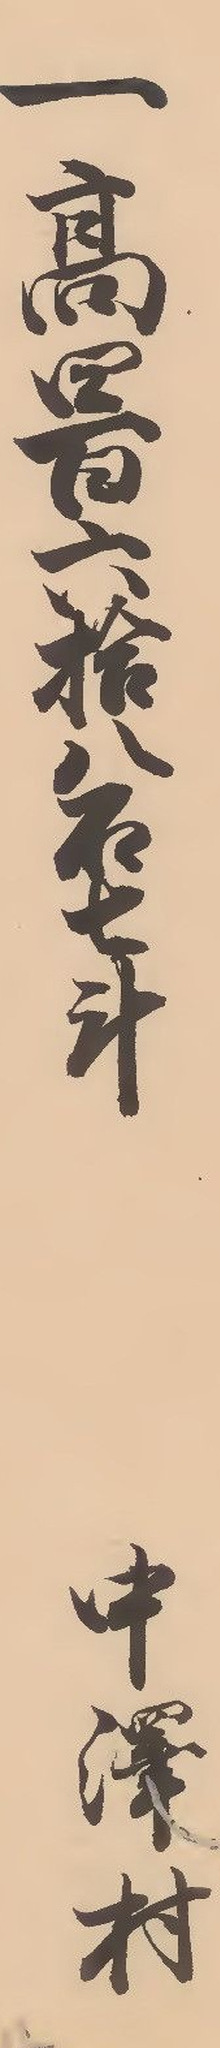一高四百六拾八石七斗中沢村
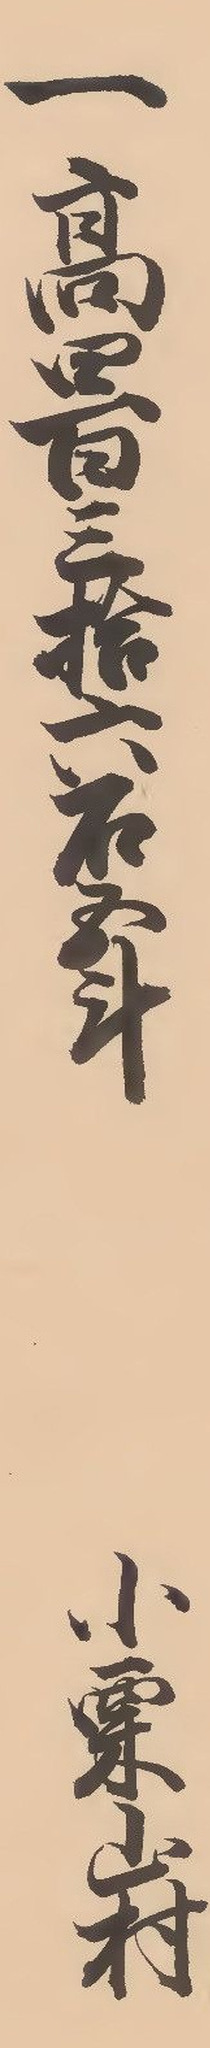一高四百三拾六石五斗小栗山村
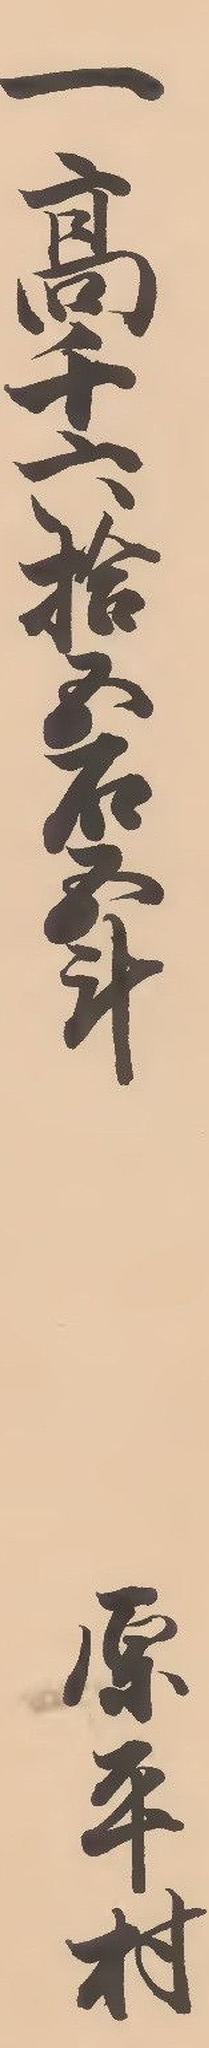一高千六拾五石五斗原平村
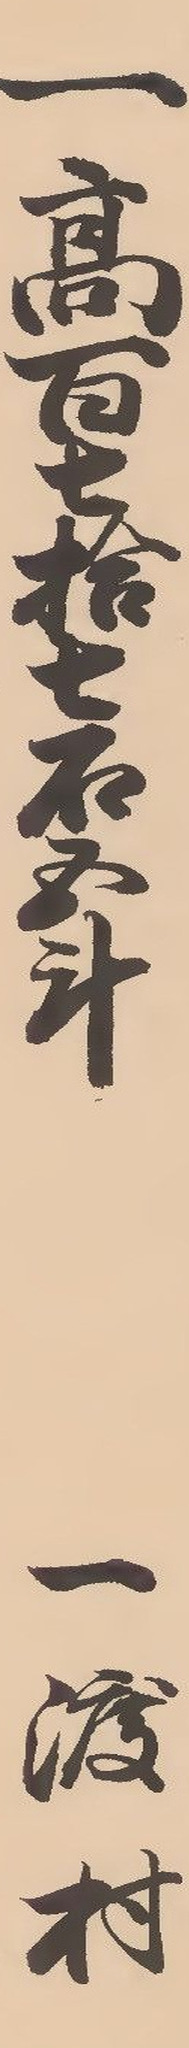一高百七拾七石五斗一渡村
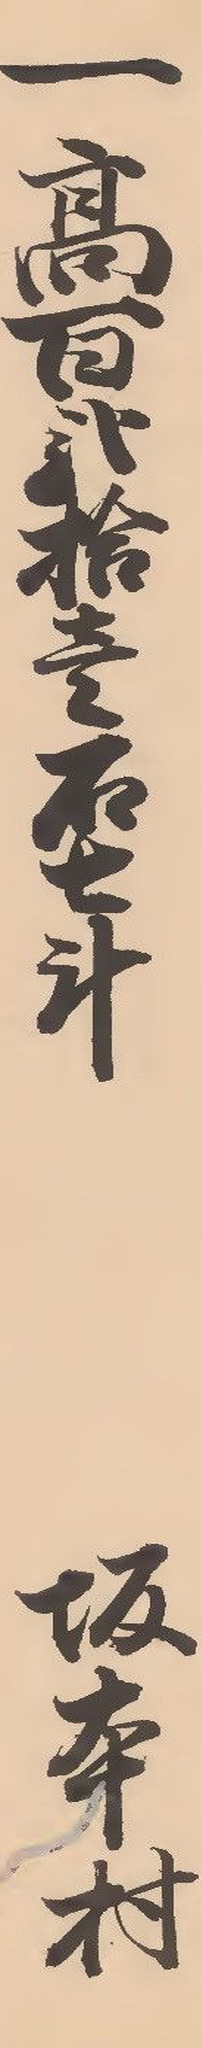一高百弐拾壱石七斗坂本村
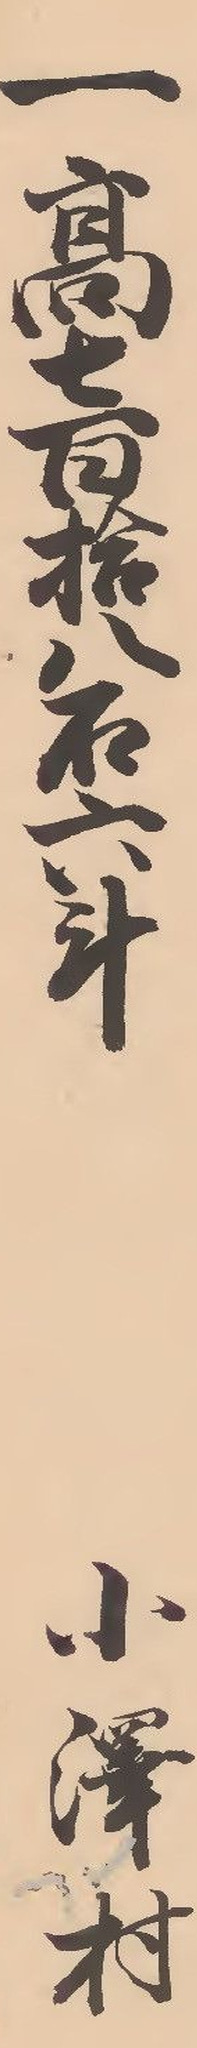一高七百拾八石六斗小沢村

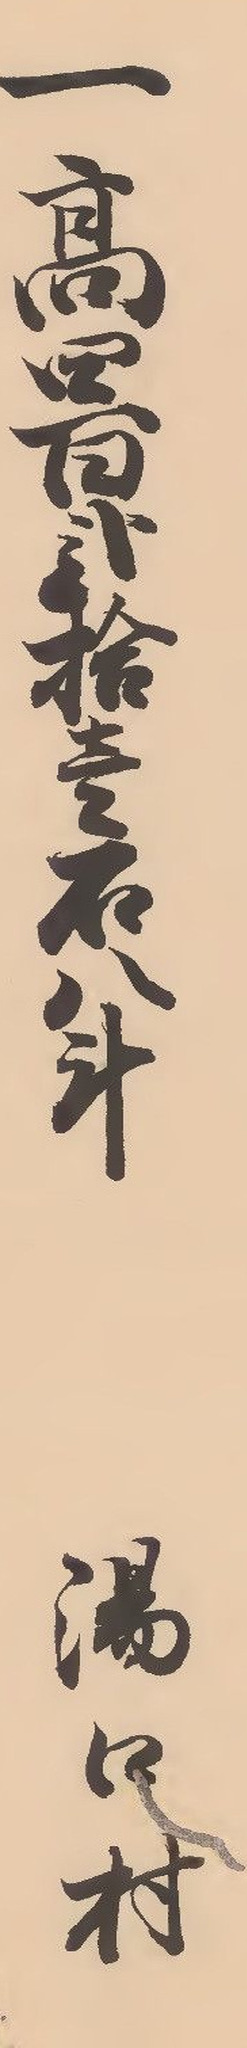一高四百弐拾壱石八斗湯口村
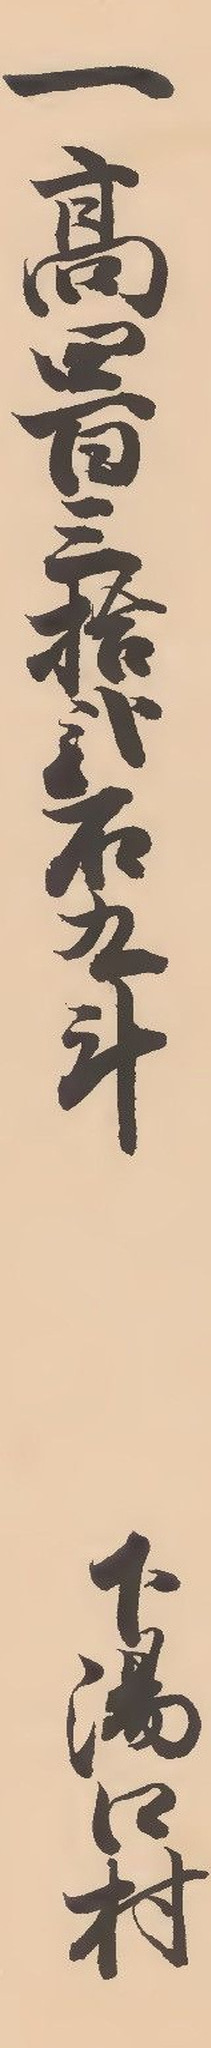一高四百三拾弐石九斗下湯口村
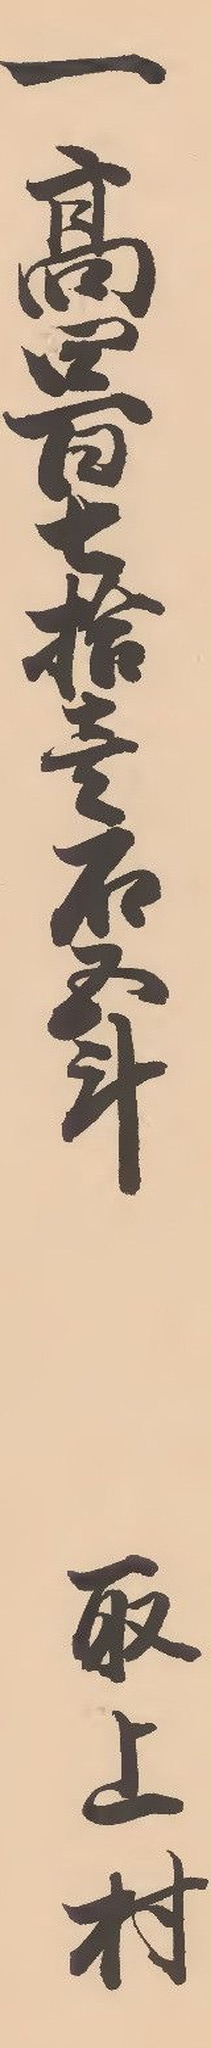一高四百七拾壱石五斗取上村
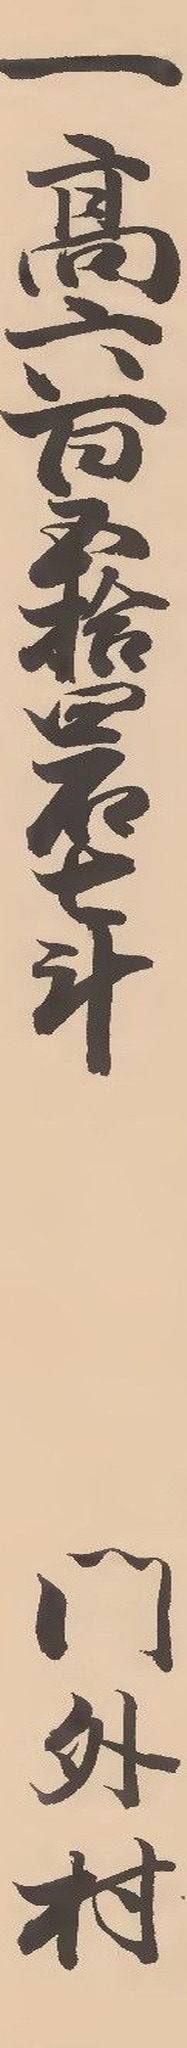一高六百五拾四石七斗門外村
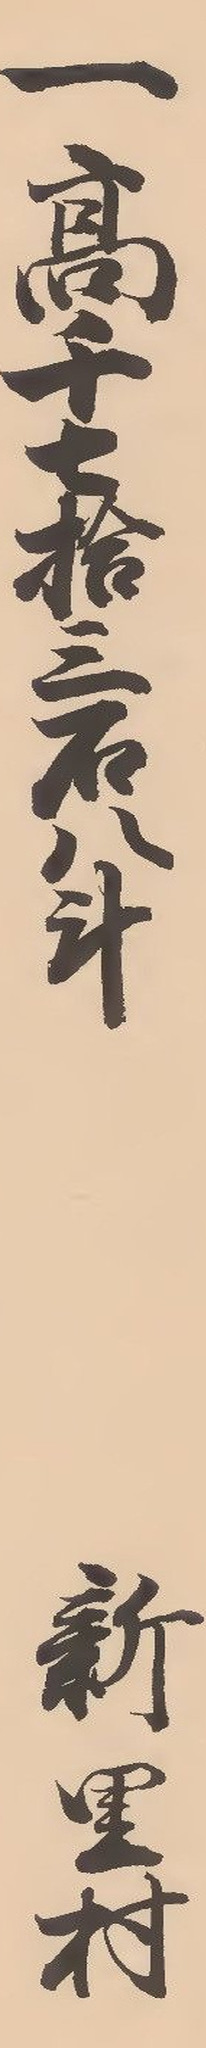一高千七拾三石八斗新里村
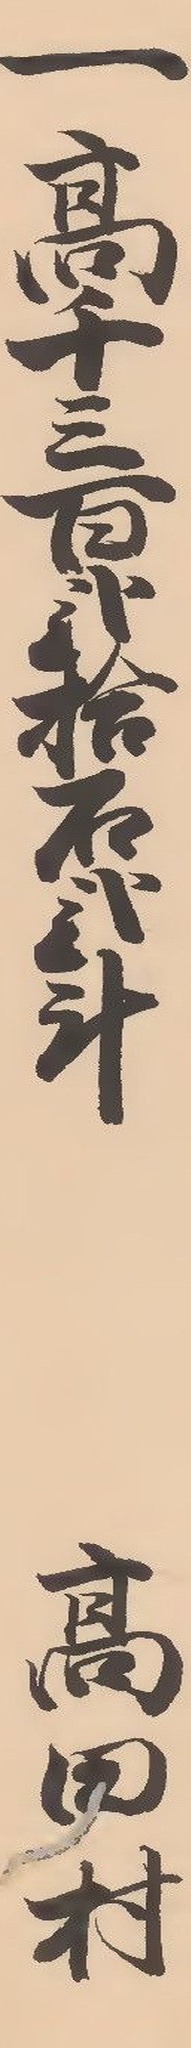一高千三百弐拾石弐斗高田村
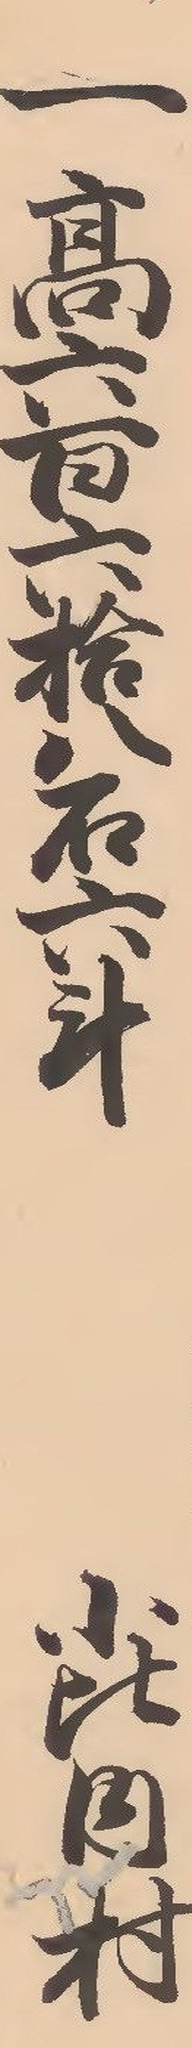一高六百六拾八石六斗小比内村

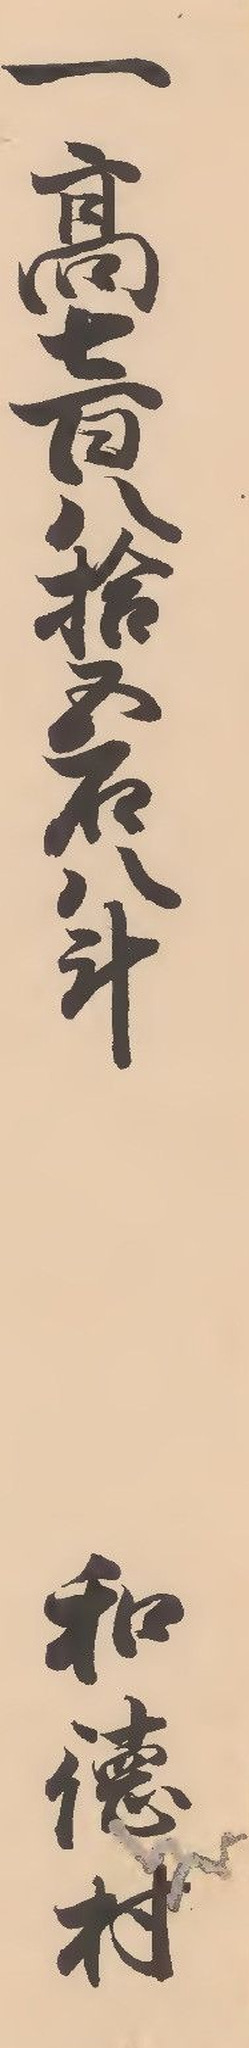一高七百八拾五石八斗和徳村
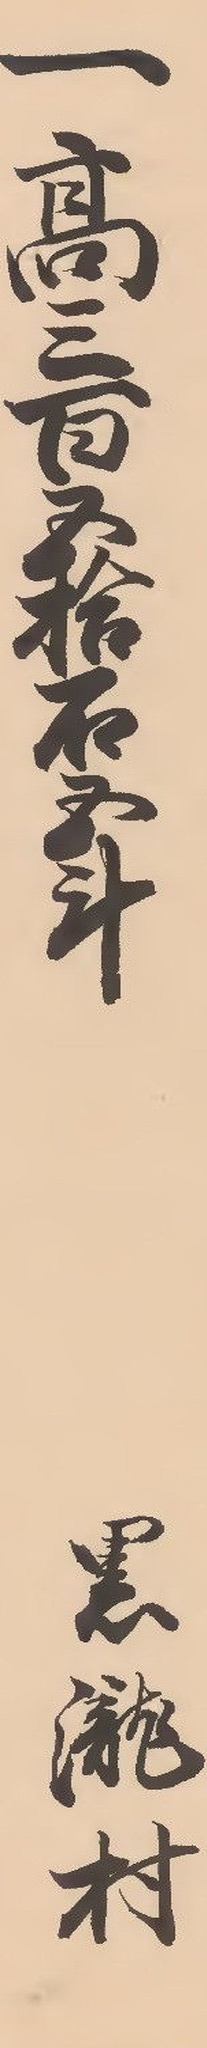一高三百五拾石五斗黒滝村
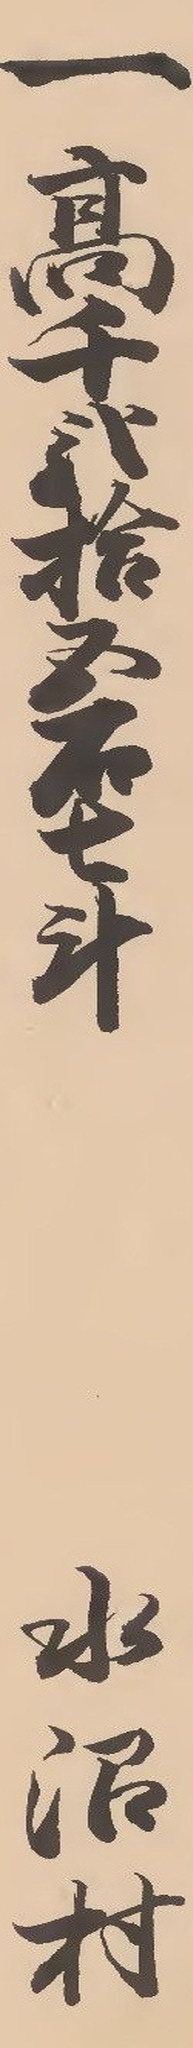一高千弐拾五石七斗水沼村
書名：陸奥国郷帳　７
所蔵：国立公文書館 National Archives of Japan
